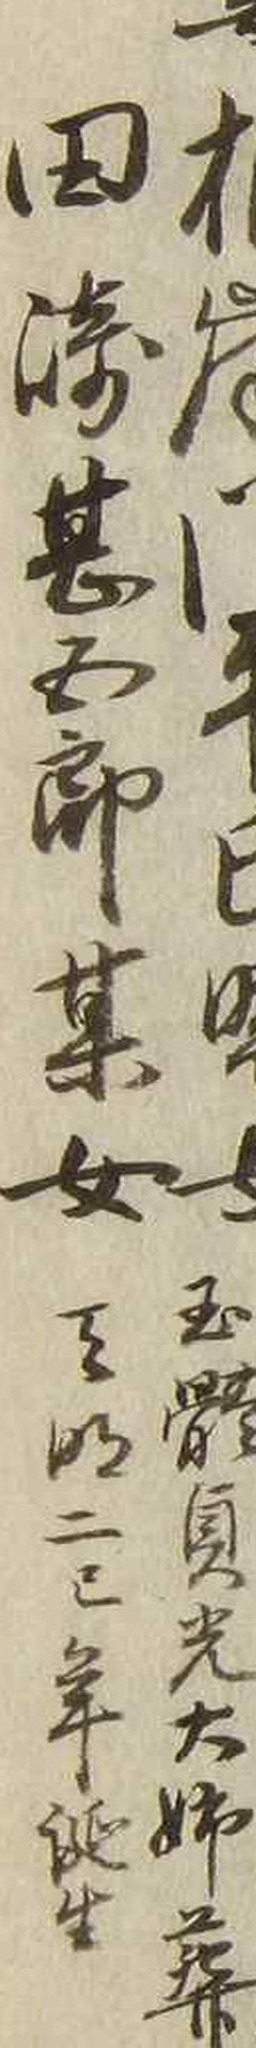田崎甚五郎某女天明二巳年誕生

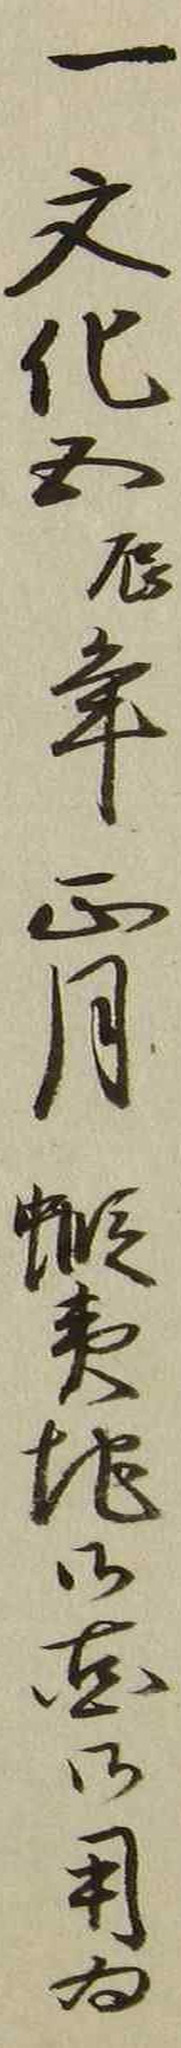一文化五辰年正月蝦夷地御固御用為
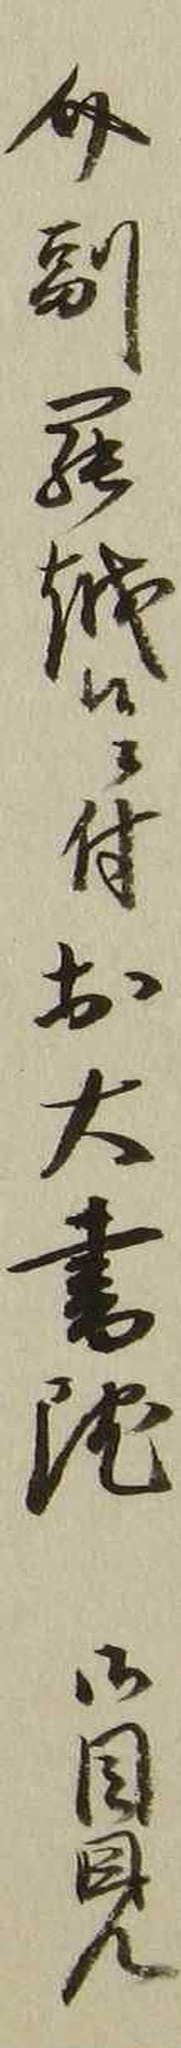介副罷越候に付於大書院御目見
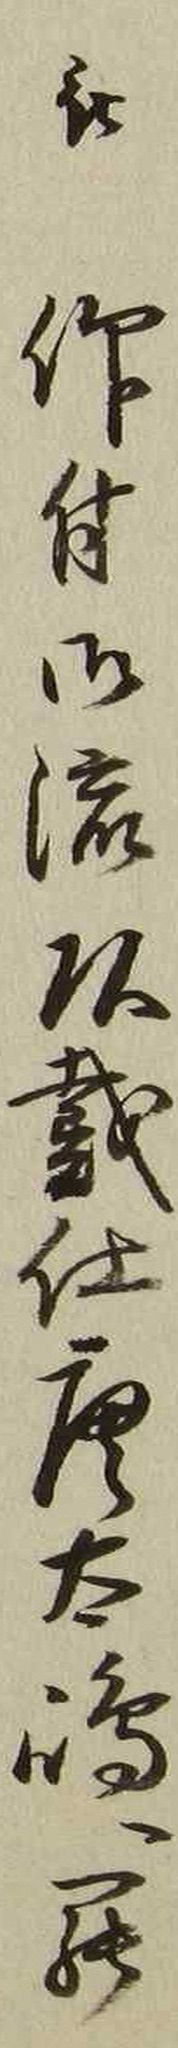被仰付御流頂戴仕唐太嶋へ罷
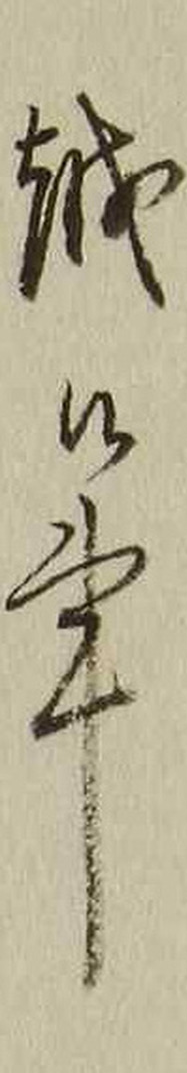越候事
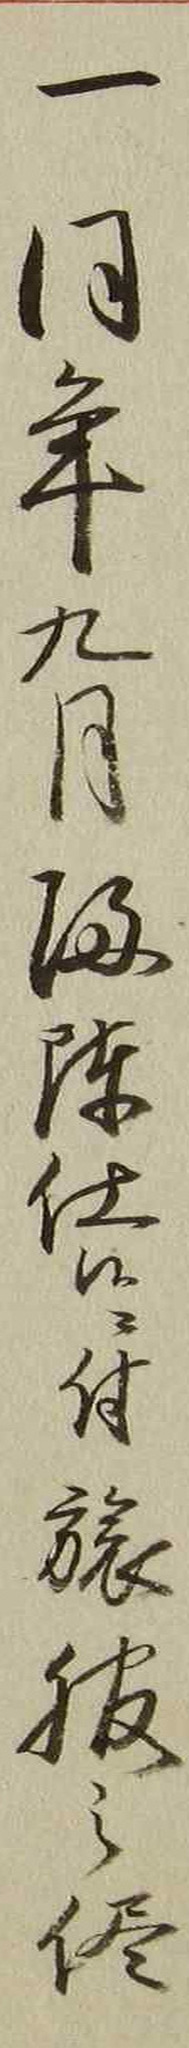一同年九月帰陣仕候に付旅服之侭
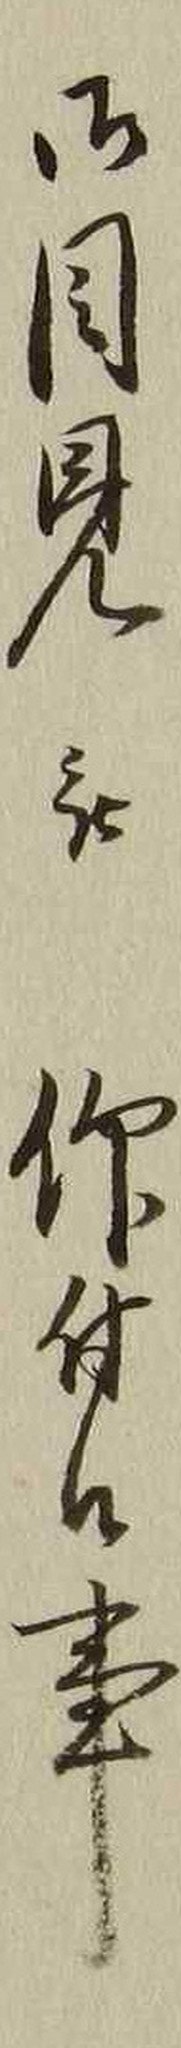御目見被仰付候事
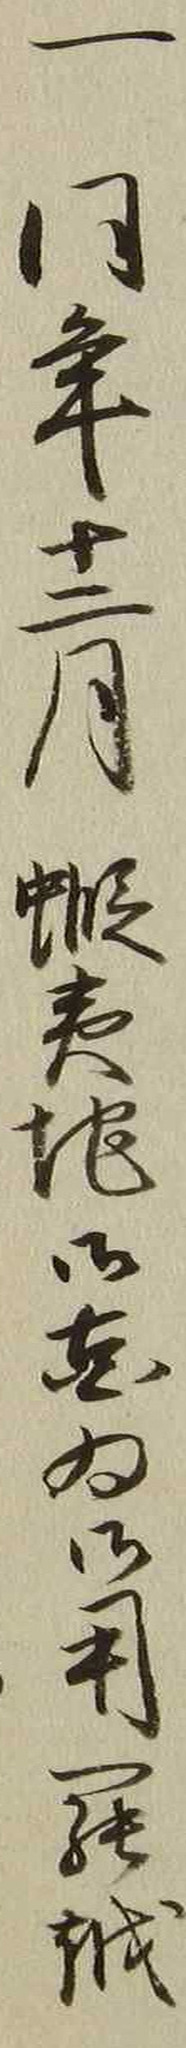一同年十二月蝦夷地御固為御用罷越
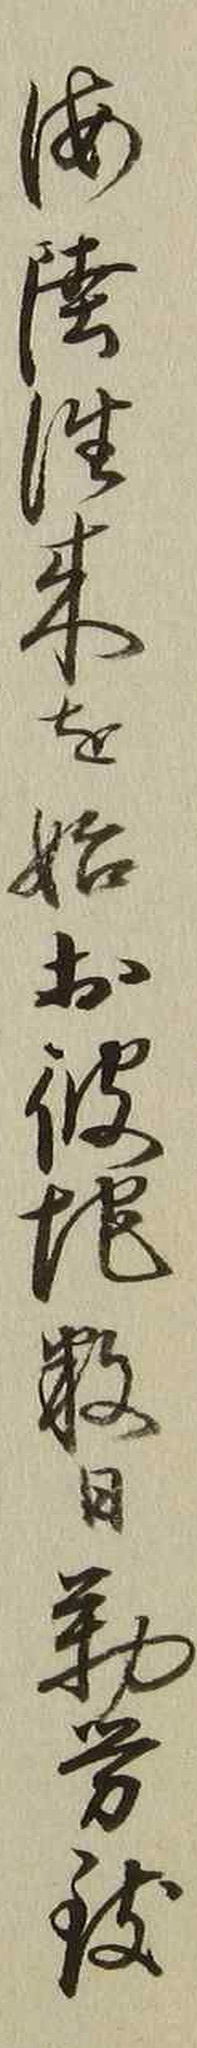海陸往来を始於彼地数日勤労致
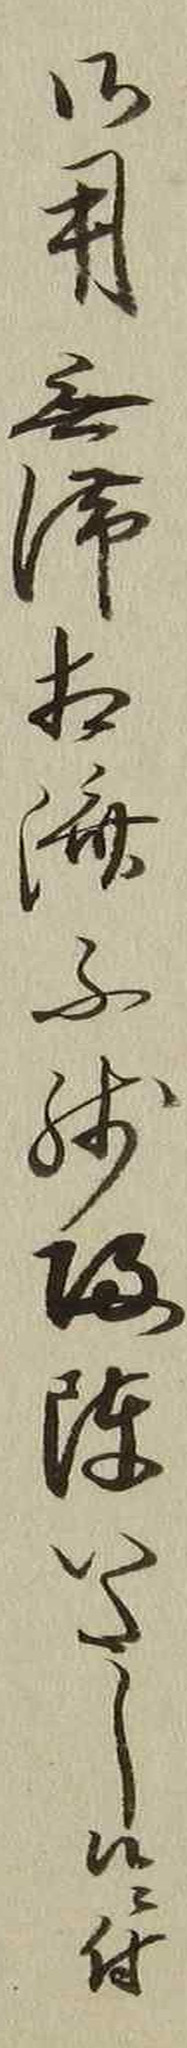御用無滞相済不残帰陣いたし候に付
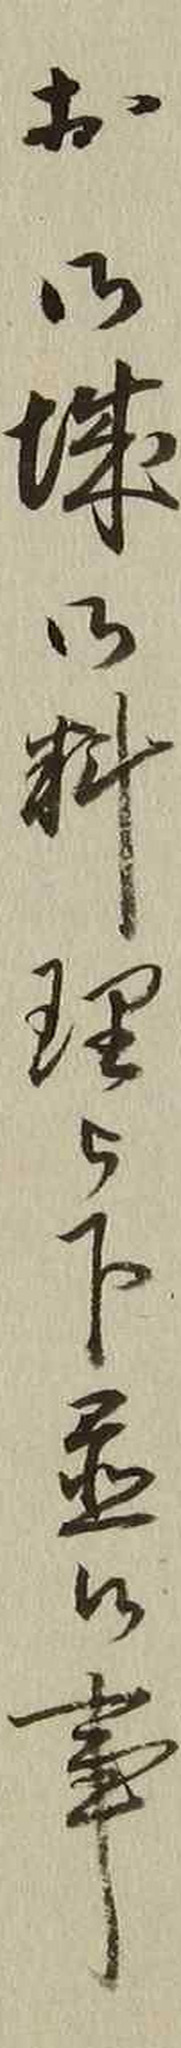於御城御料理被下置候事
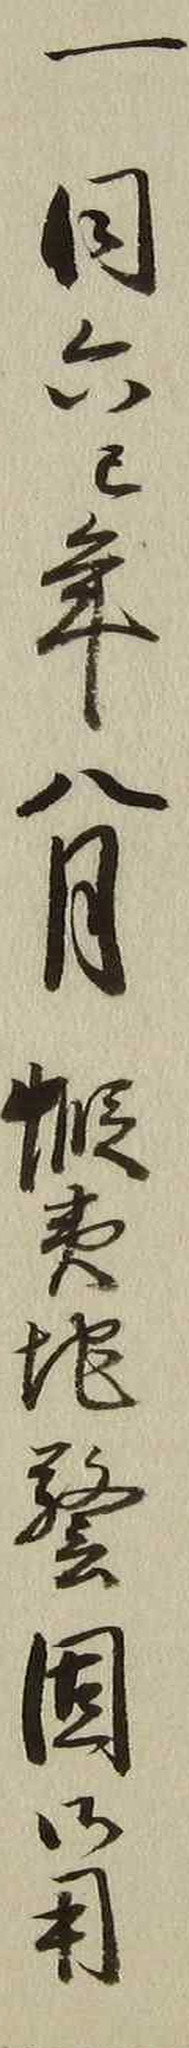一同六年巳月八月蝦夷地警固御用
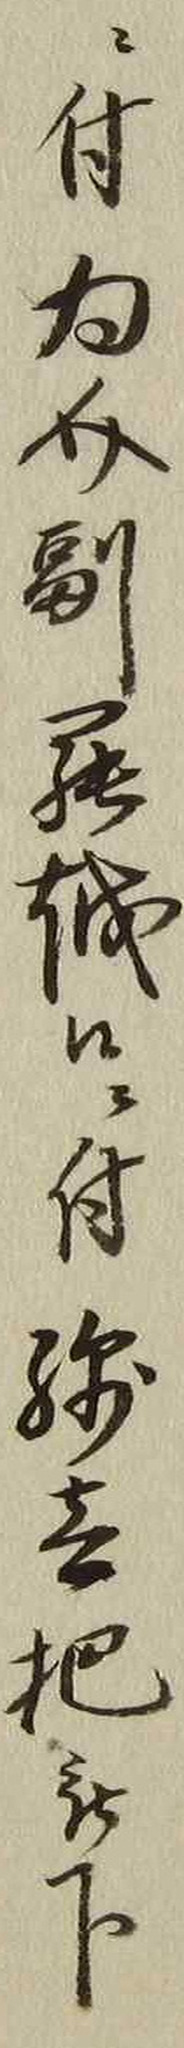に付為介副罷越候に付綿壱把被下
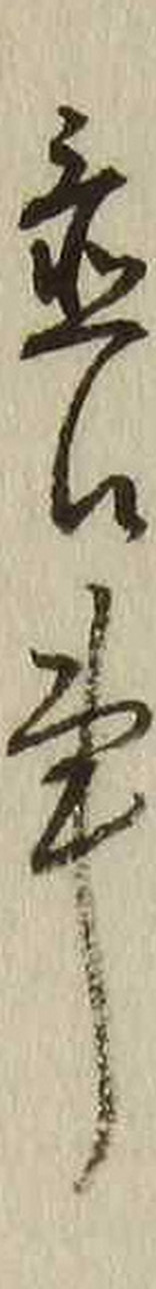置候事
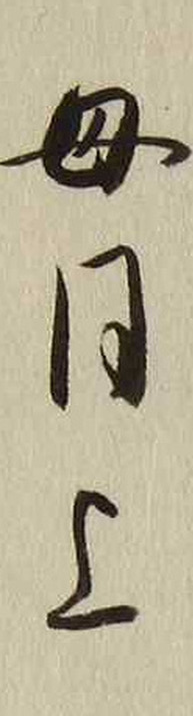母同上
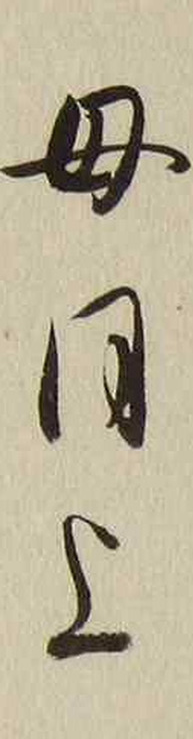母同上
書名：諸士系譜　巻之133　た之部9
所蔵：会津若松市立会津図書館
